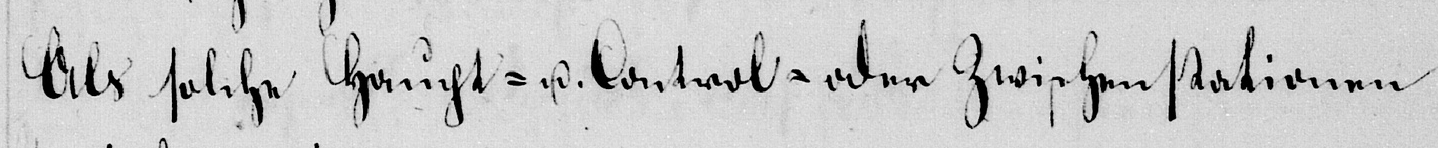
Als solche Haupt. u. Control- oder Zwischenstationen
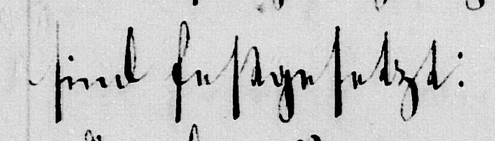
sind festgesetzt:
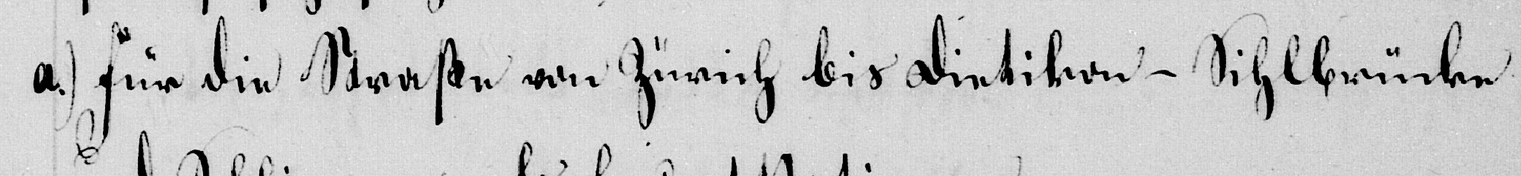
a.) Für die Straße von Zürich bis Dietikon – Sihlbrücke
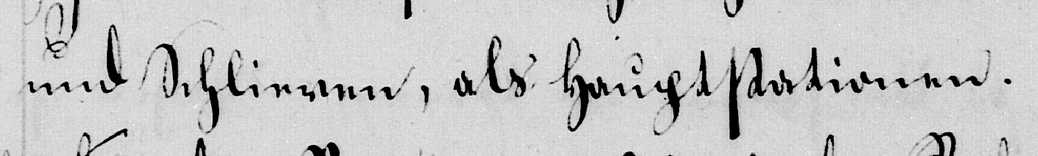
und Schlieren, als Hauptstationen.
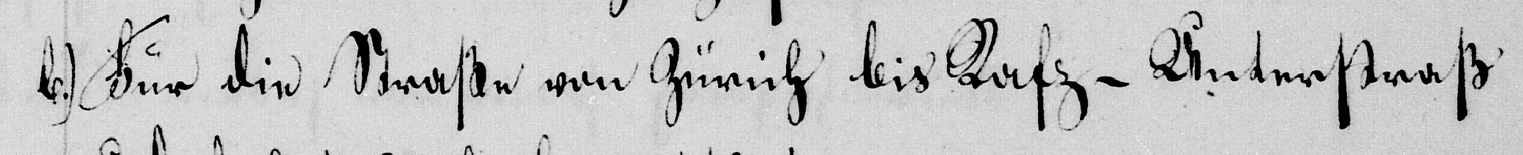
b.) Für die Straße von Zürich bis Rafz – Unterstraß
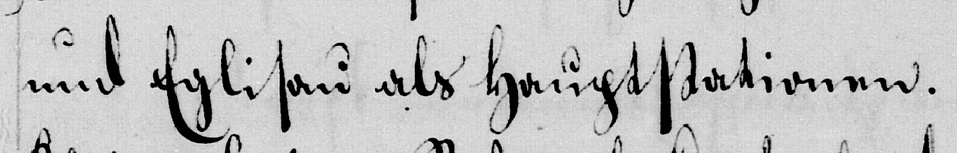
und Eglisau als Hauptstationen.
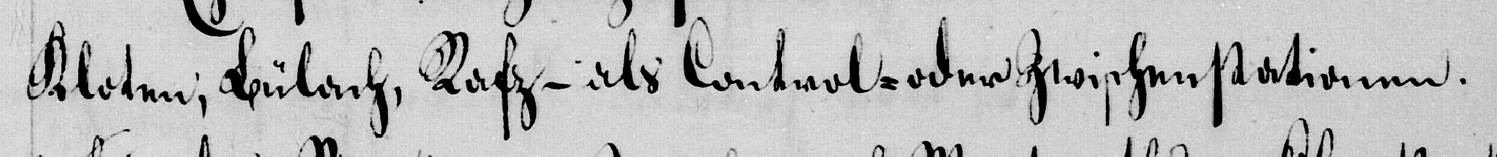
Kloten, Bülach, Rafz – als Control- oder Zwischenstationen.
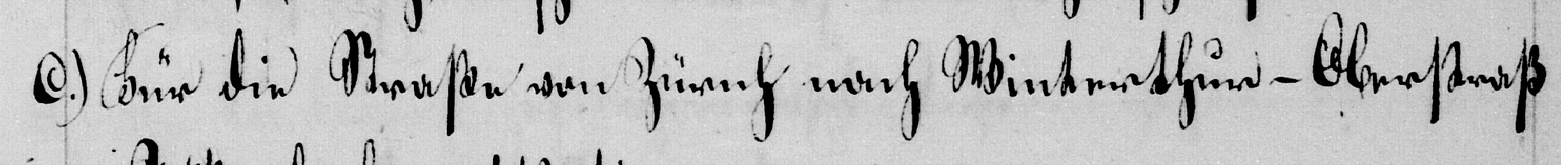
c.) Für die Straße von Zürich nach Winterthur – Oberstraß
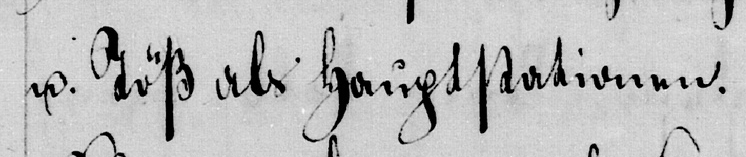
u. Töß als Hauptstationen.
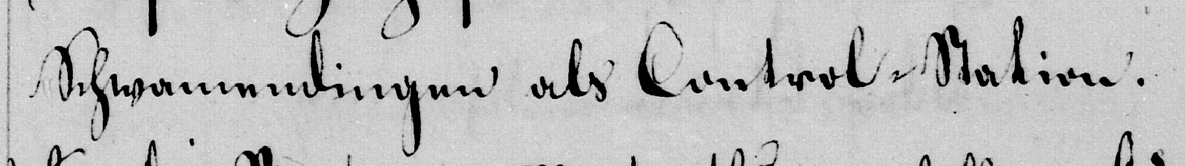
Schwamendingen als Control-Station.
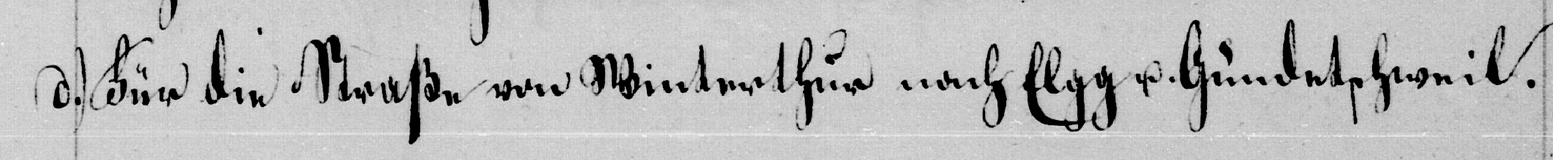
d.) Für die Straße von Winterthur nach Elgg u. Gundetschweil.
